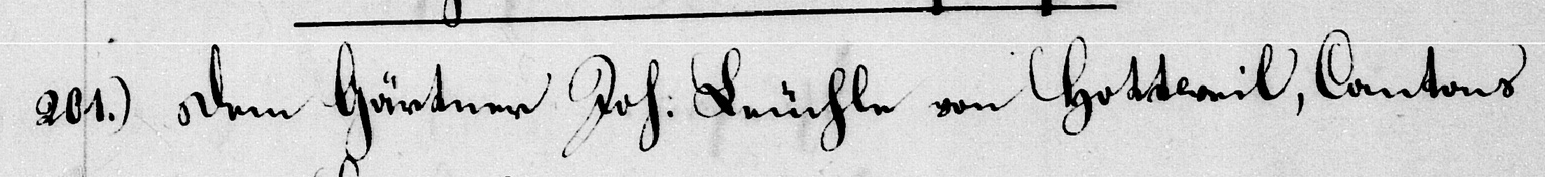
201.) Dem Gärtner Joh. Leuchle von Hottweil, Cantons
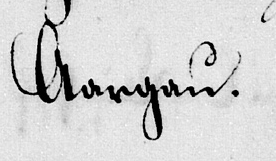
Aargau.
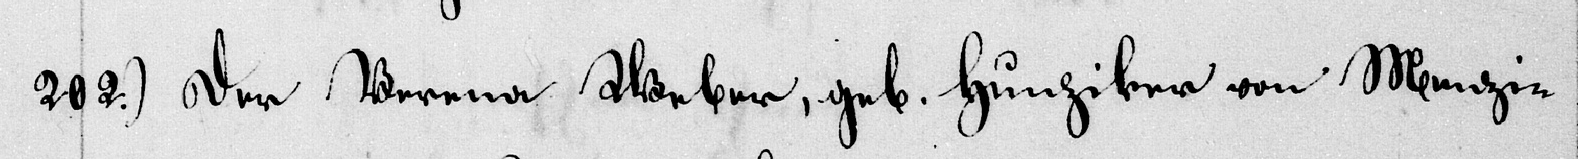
202.) Der Verena Weber, geb. Hunziker von Menzi¬
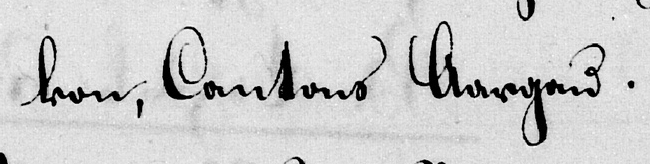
kon, Cantons Aargau.
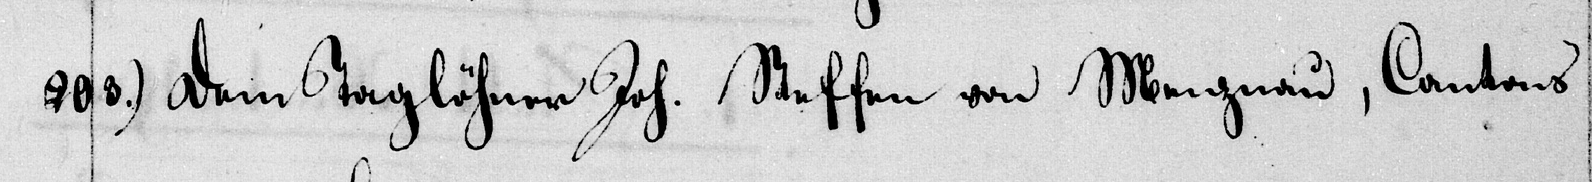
203.) Dem Taglöhner Joh. Steffen von Menznau, Cantons
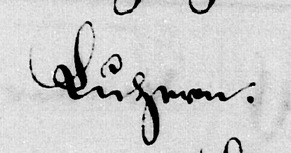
Luzern.
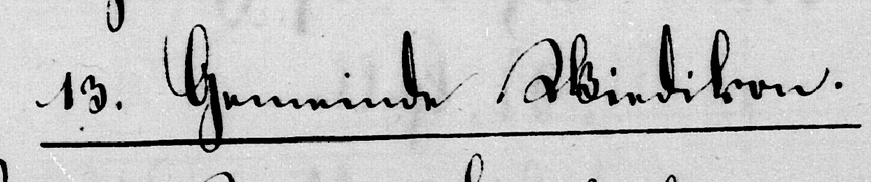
13. Gemeinde Wiedikon.
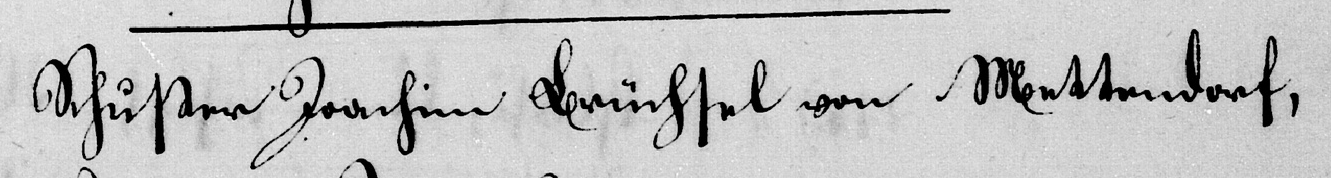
Schuster Joachim Brüchsel von Mettendorf,
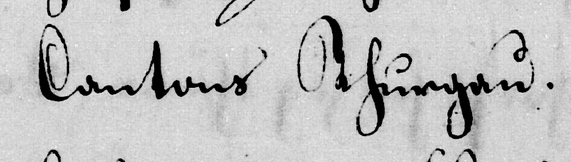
Cantons Thurgau.
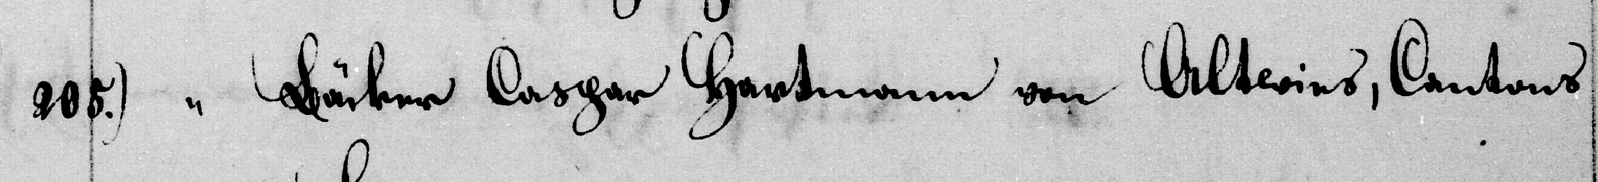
205.) “ Bäcker Caspar Hartmann von Altwies, Cantons
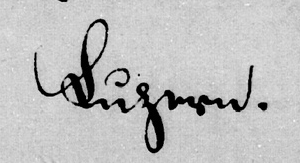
Luzern.
